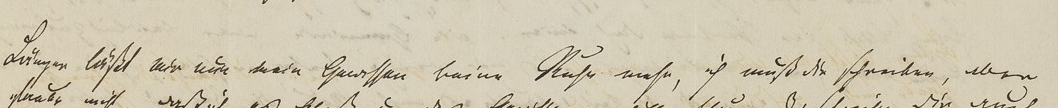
Länger läßt mir nun mein Gewissen keine Ruhe mehr, ich muß dir schreiben, aber
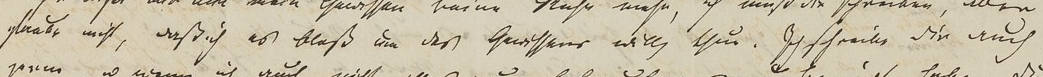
glaube nicht, daß ich es bloß um des Gewissens willen thue. Ich schreibe dir auch
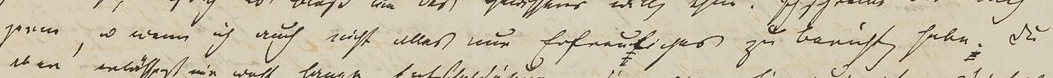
gerne, u wenn ich auch nicht alles nur Erfreuliches zu berichten habe. Du
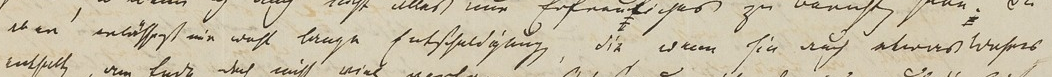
aber erlässest mir wohl lange Entschuldigungen, die, wenn sie auch etwas Wahres
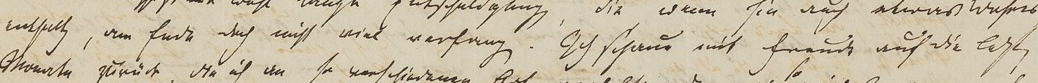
enthalten, am Ende doch nicht viel verfangen. Ich schaue mit Freude auf die letzten
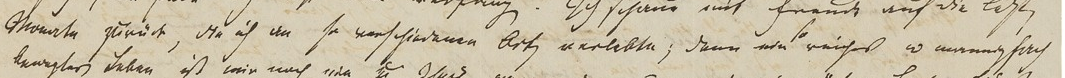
Monate zurück, die ich an so verschiedenen Orten verlebte; denn ein so reiches u mannigfach
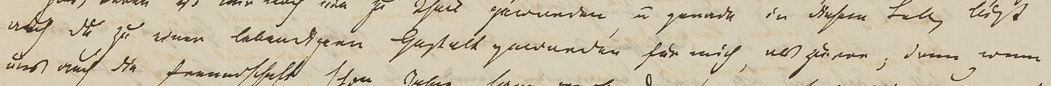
auch du zu einer lebendigern Gestalt geworden für mich, als zuvor; denn wenn
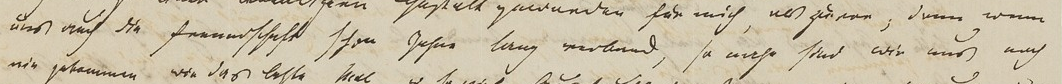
uns auch die Freundschaft schon Jahre lang verband, so nahe sind wir uns noch
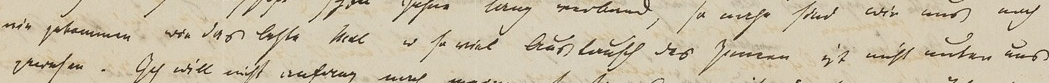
nie gekommen wie das letzte Mal u so viel Austausch des Innern ist nicht unter uns
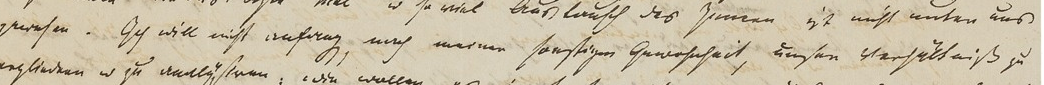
gewesen. Ich will nicht anfangen, nach meiner sonstigen Gewohnheit, unser Verhältniß zu
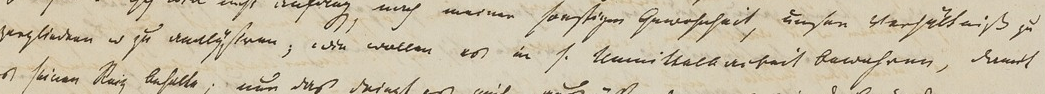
zergliedern u zu analysiren; wir wollen es in s. Unmittelbarkeit bewahren, damit
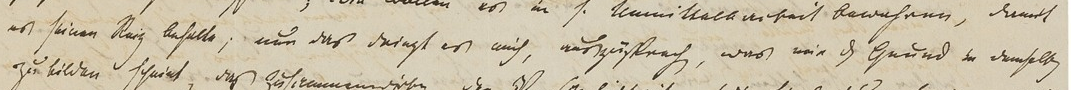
es seinen Reiz behalte; nur das dringt es mich, auszusprechen, was mir den Grund v. demselben
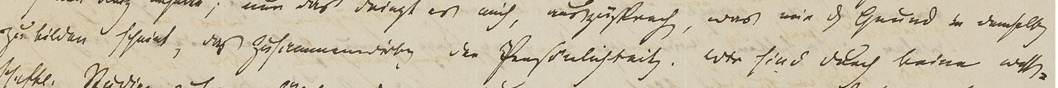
zu bilden scheint, das Zusammenwirken der Persönlichkeiten. Wir sind durch keine wissen-
